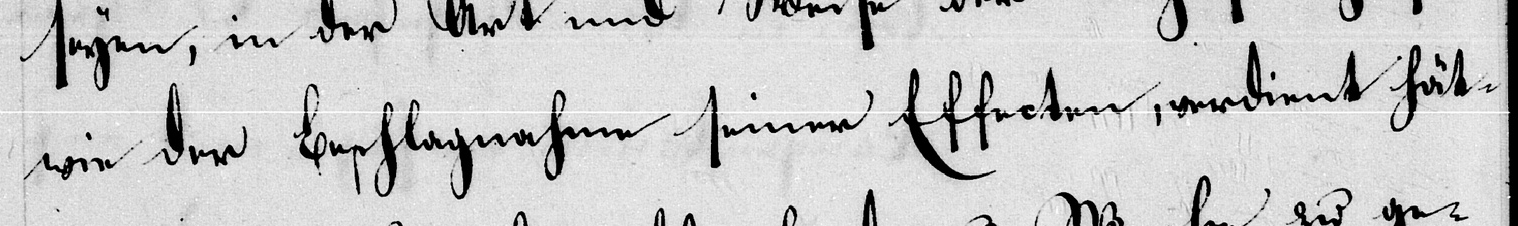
wie der Beschlagnahme seiner Effecten, verdient hät¬
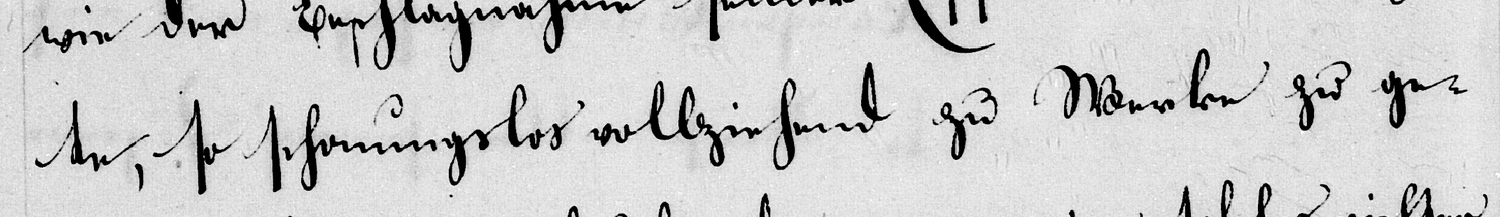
te, so schonungslos vollziehend zu Werke zu ge¬
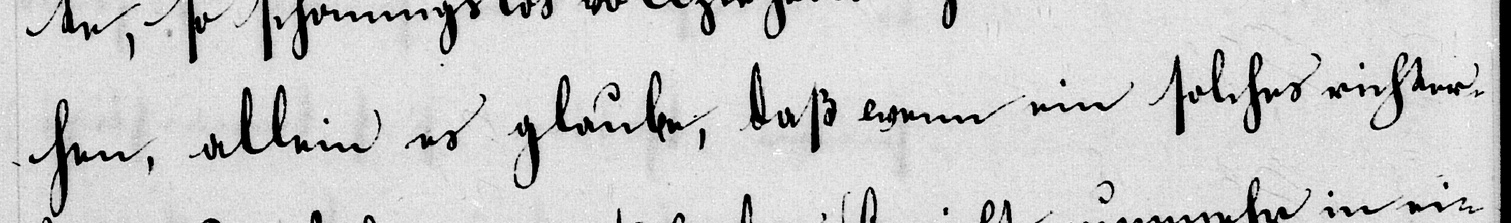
hen, allein es glaube, daß wenn ein solches richter¬
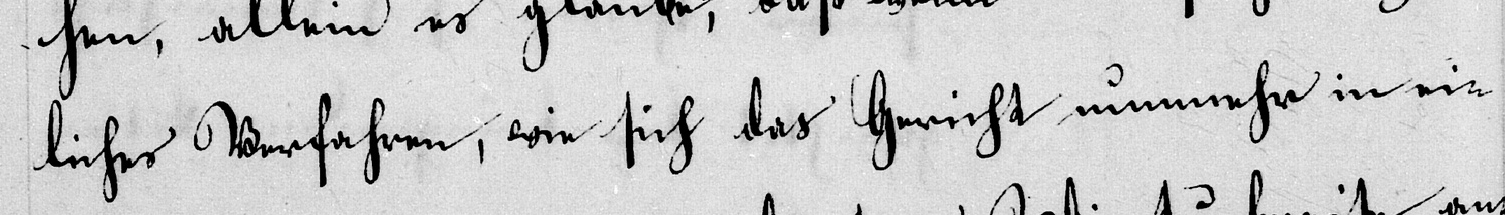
liches Verfahren, wie sich das Gericht nunmehr in ei¬
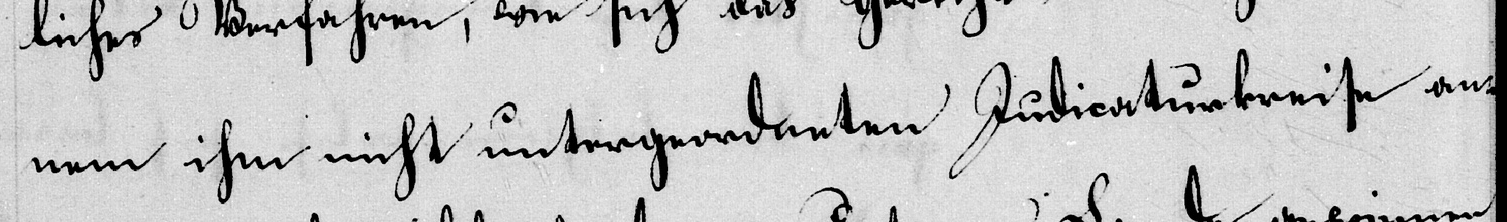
nem ihm nicht untergeordneten Judicationskreise an¬
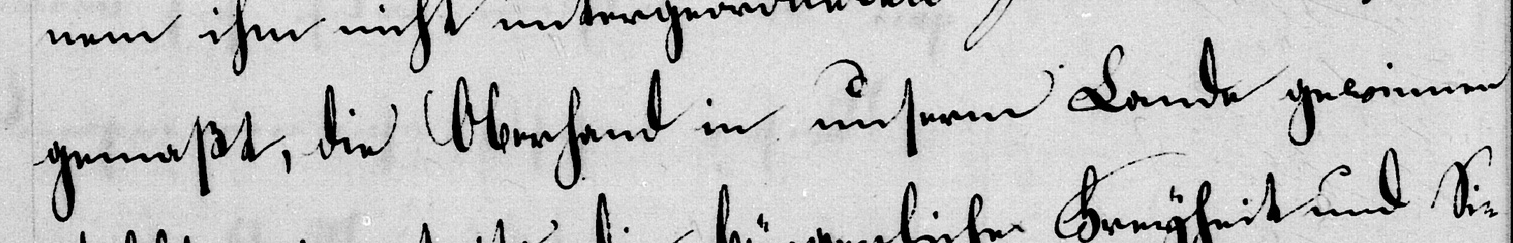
gemaßt, die Oberhand in unserm Lande gewinnen
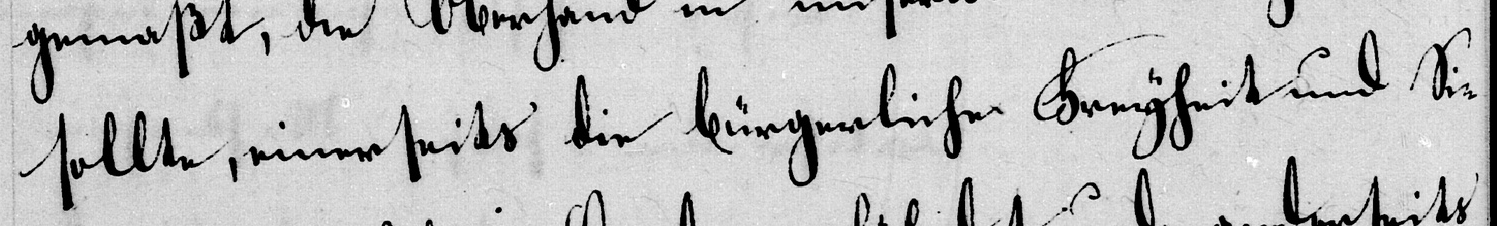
sollte, einerseits die bürgerliche Freyheit und Si¬
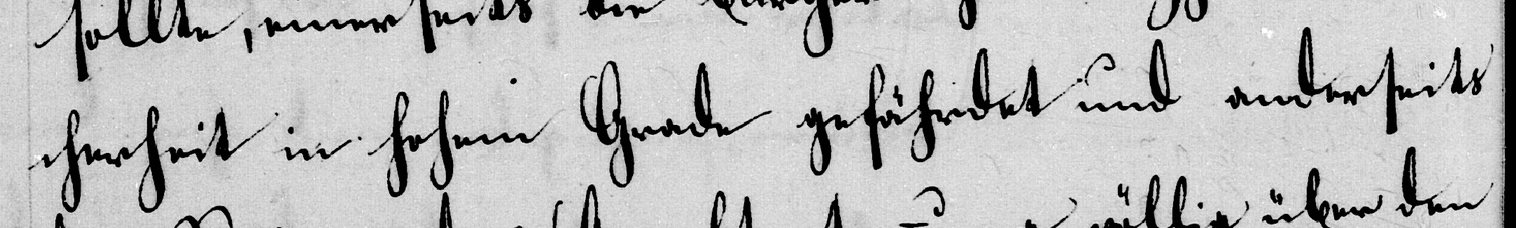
cherheit in hohem Grade gefährdet und anderseits
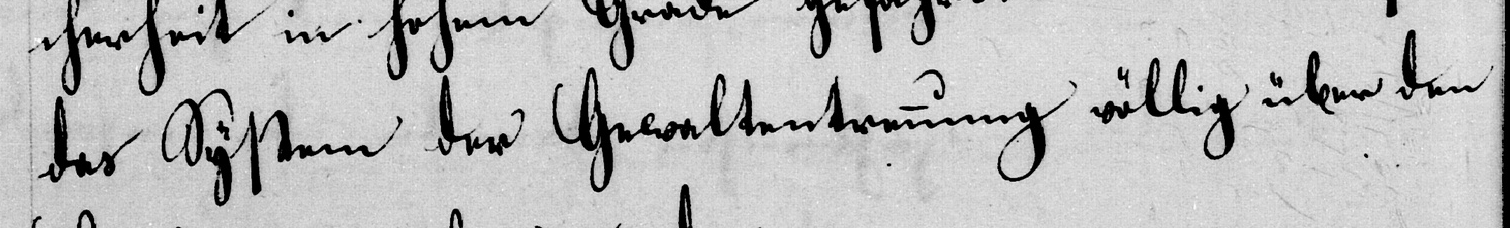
das System der Gewaltentrennung völlig über den
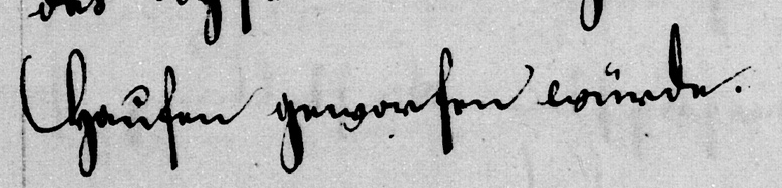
Haufen geworfen würde.
